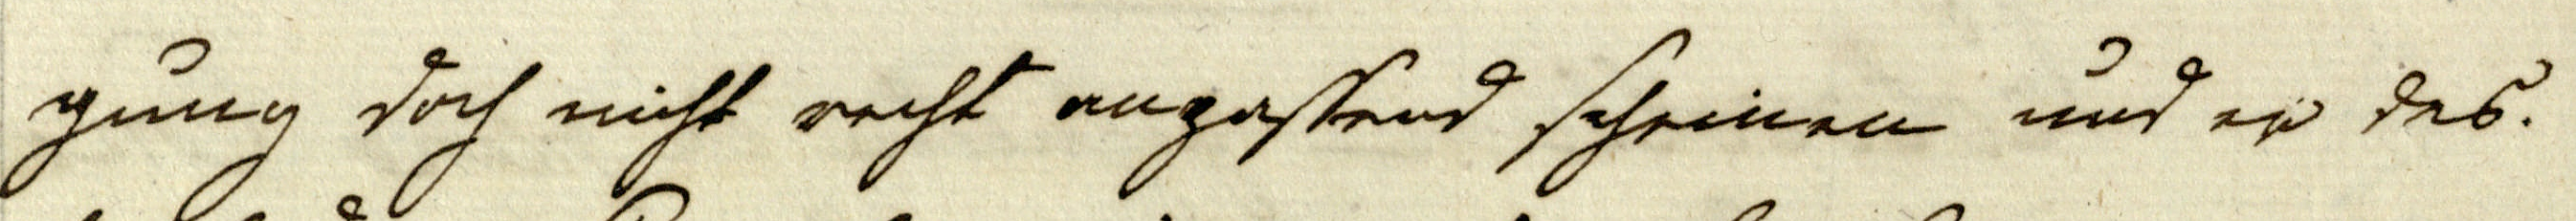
gung doch nicht recht anpassend scheinen und er des¬
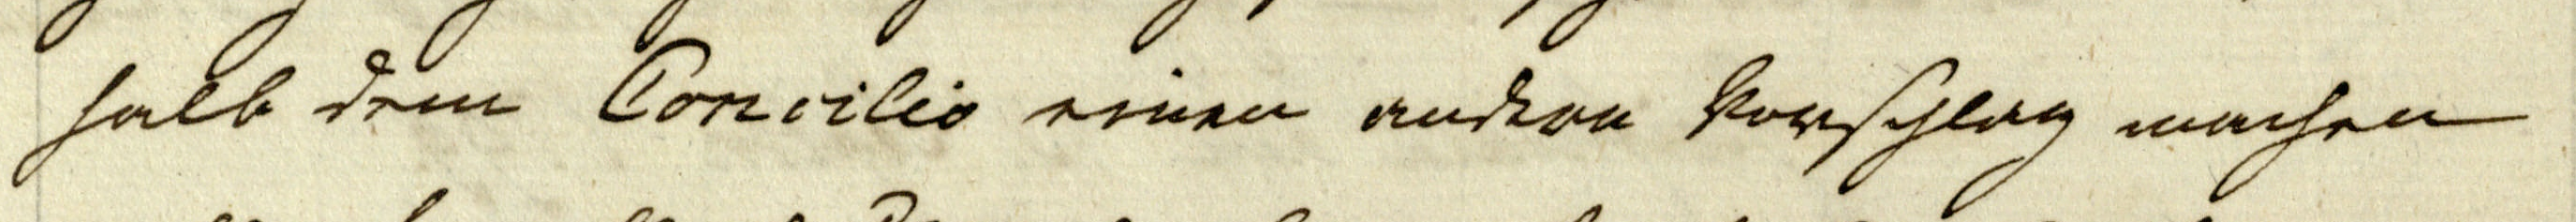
halb dem Concilio einen andern Vorschlag machen
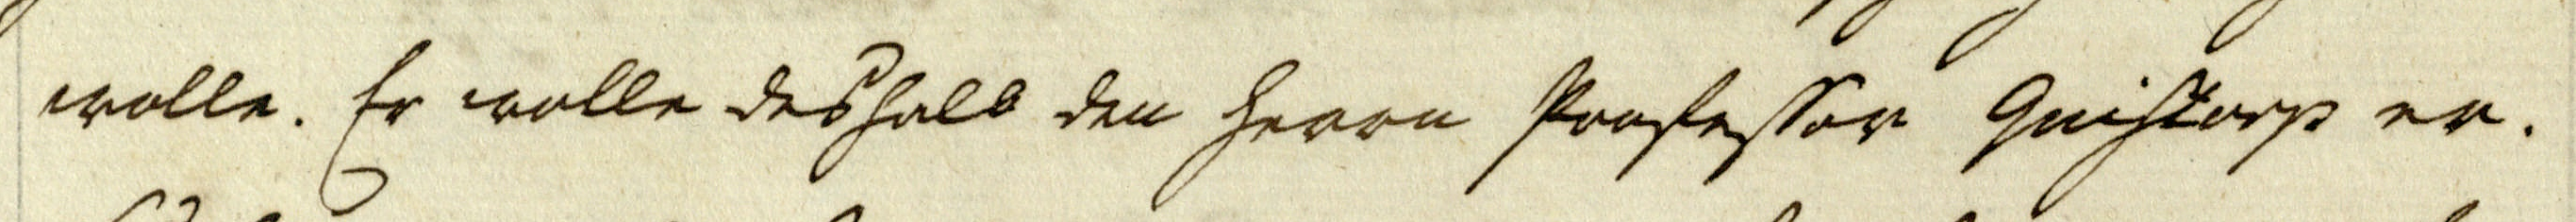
wolle. Er wolle deshalb den herrn Professor Quistorp er¬
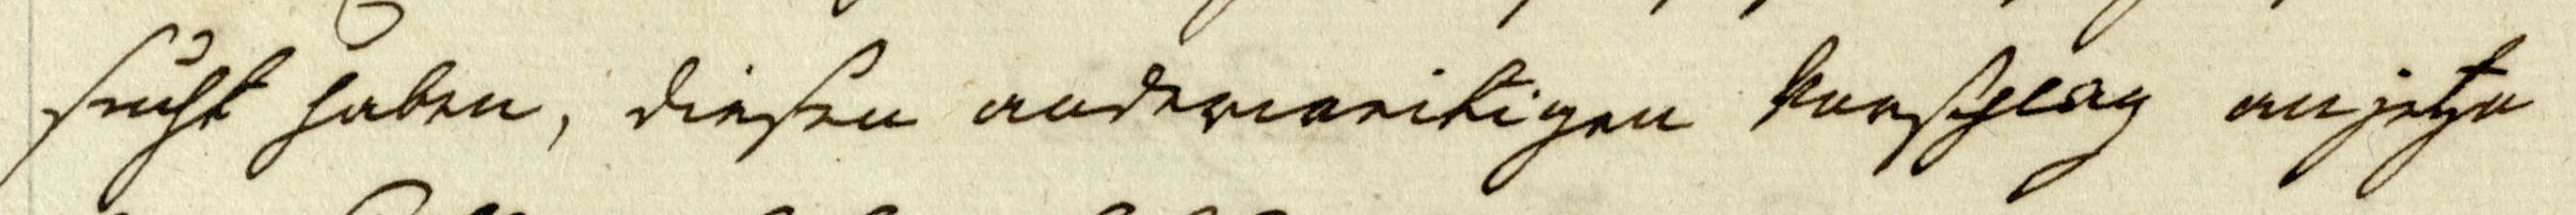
sucht haben, diesen anderweitigen Vorschlag anjetzo
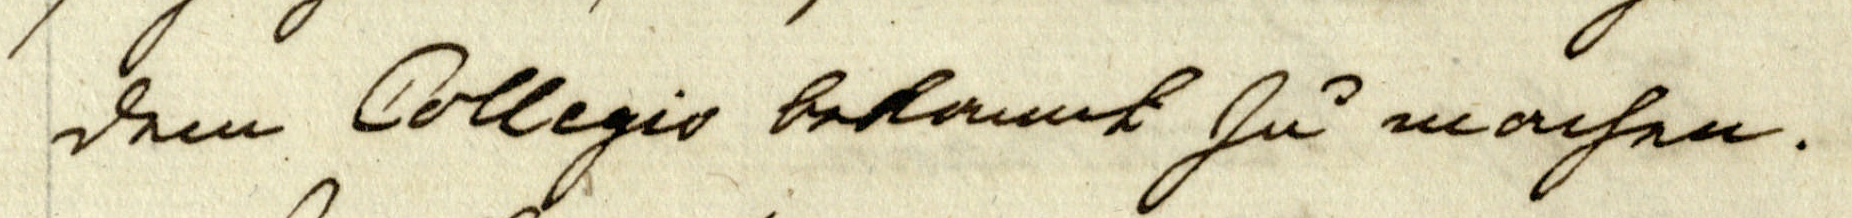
dem Collegio bekannt zu machen.
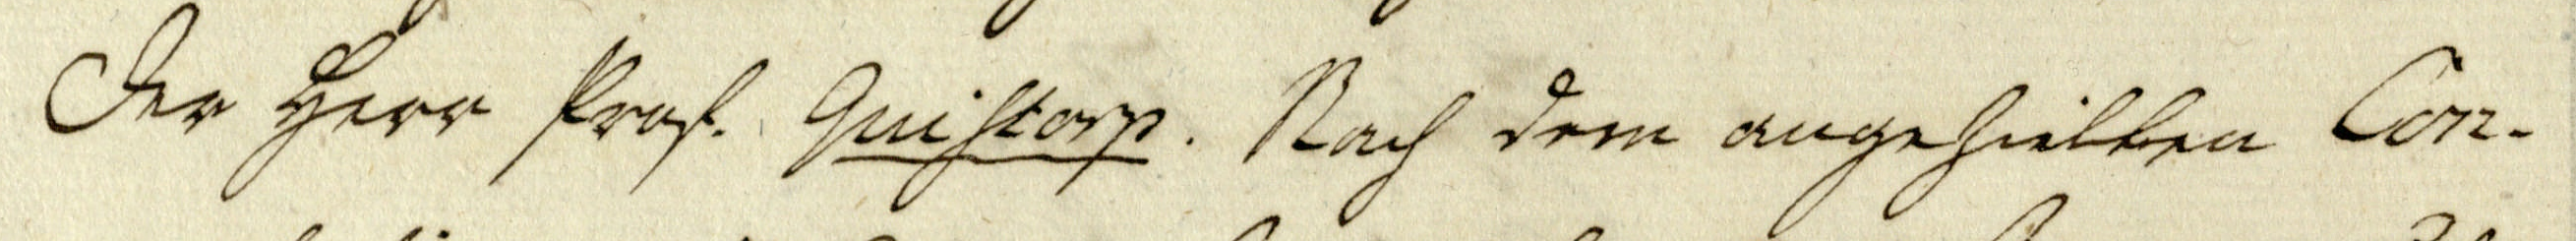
Der Herr Prof. Quistorp. Nach dem angezielten Con¬
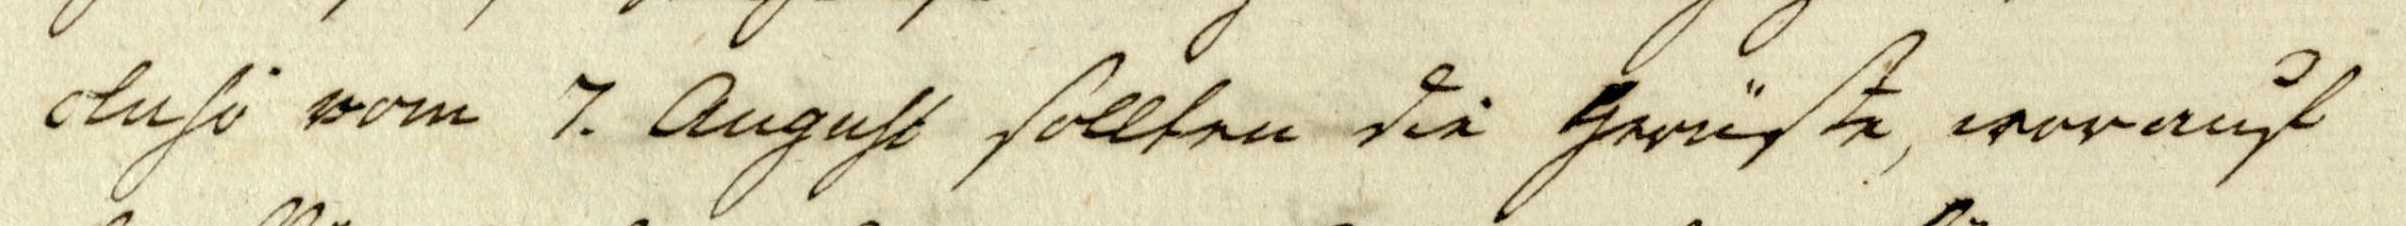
clusi vom 7. August sollten die Gerüste, worauf
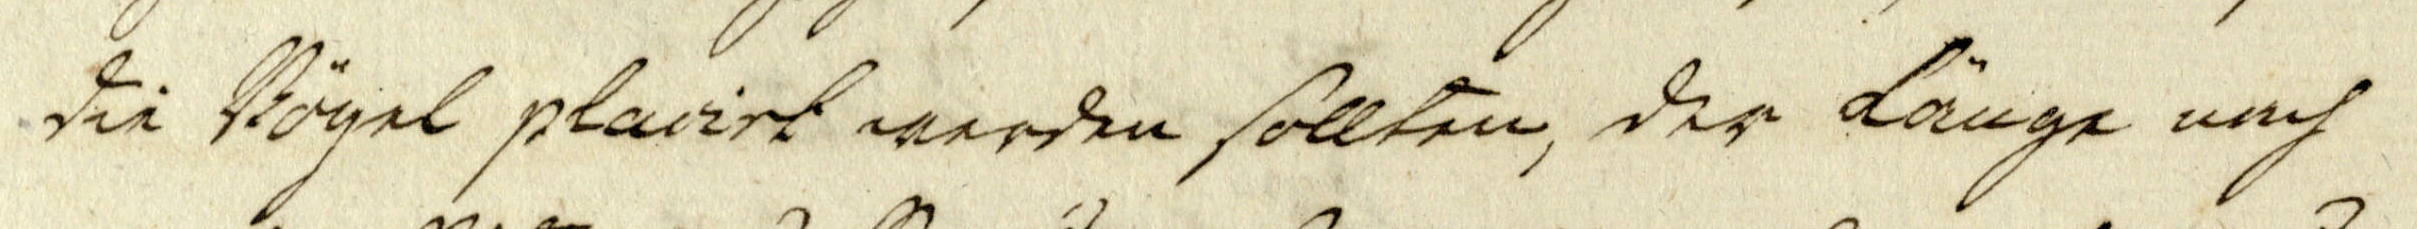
die Vögel placirt werden sollten, der Länge nach
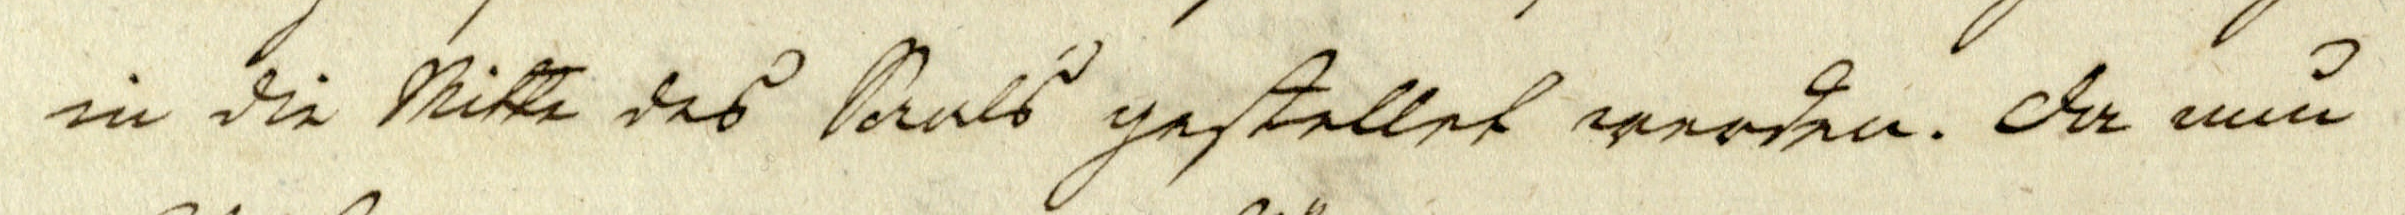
in die Mitte des Saals gestellet werden. Da nun
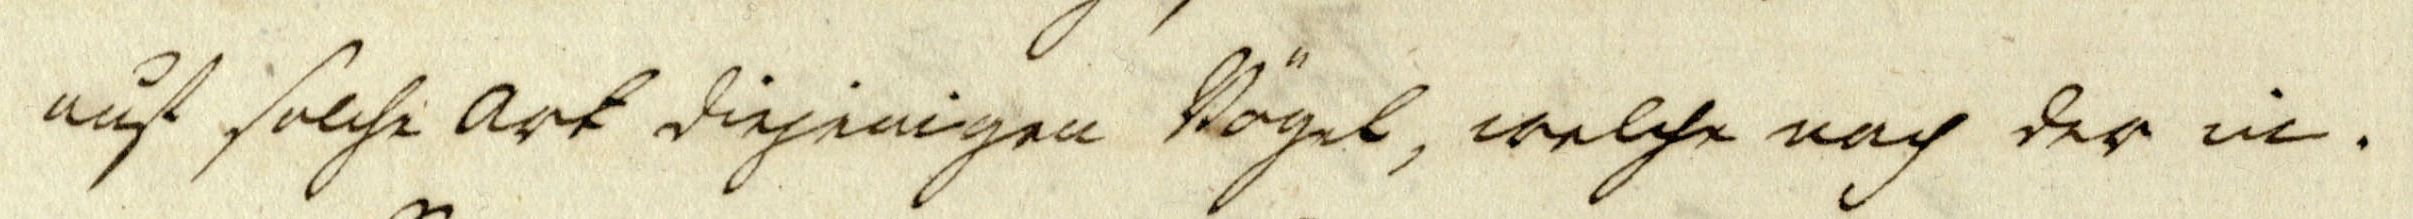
auf solche Art diejenigen Vögel, welche nach der in¬
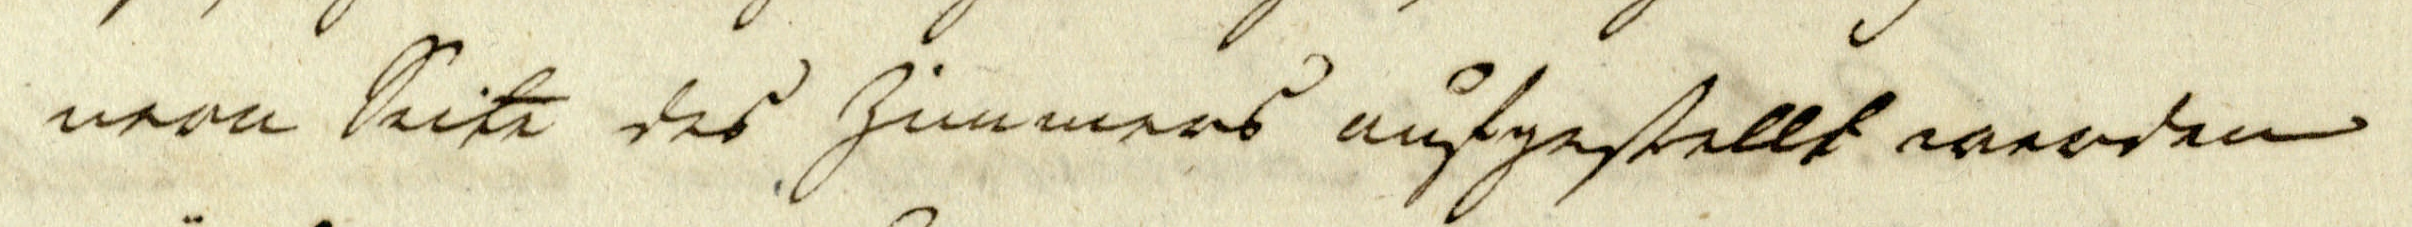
nern Seite des Zimmers aufgestellt werden
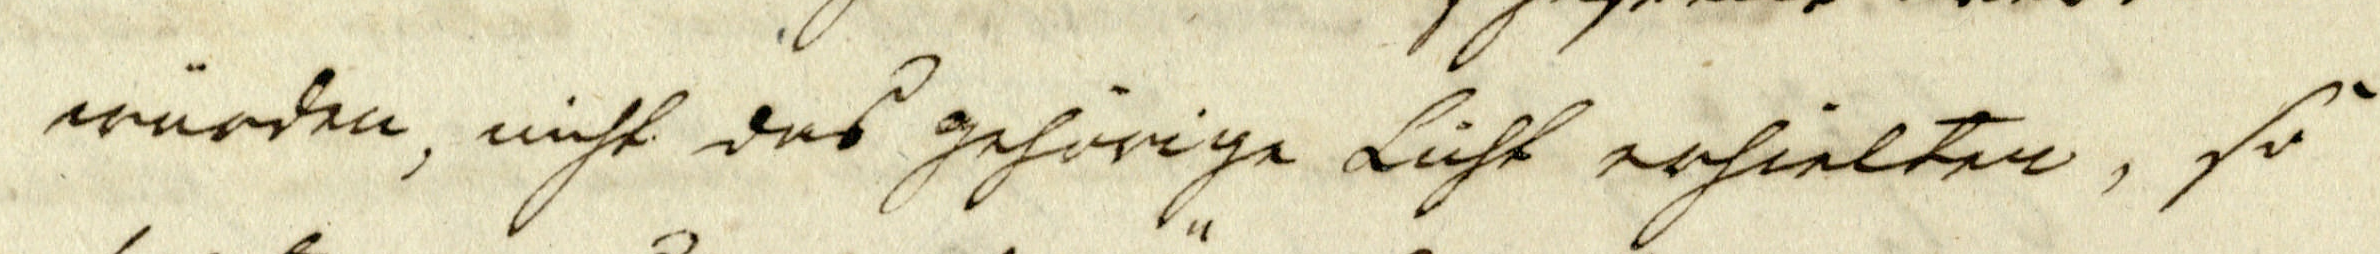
würden, nicht das gehörige Licht erhielten, so
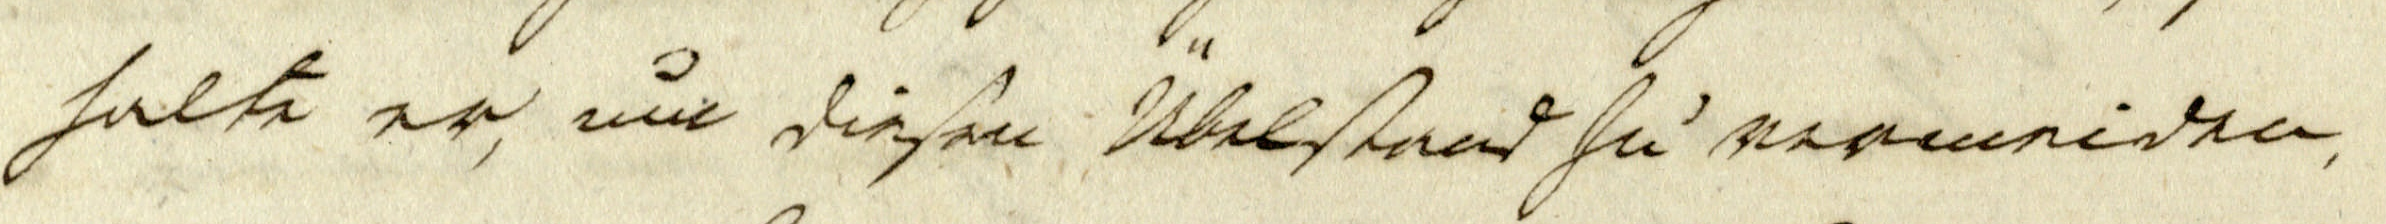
halte er, um diesen Übelstand zu vermeiden,
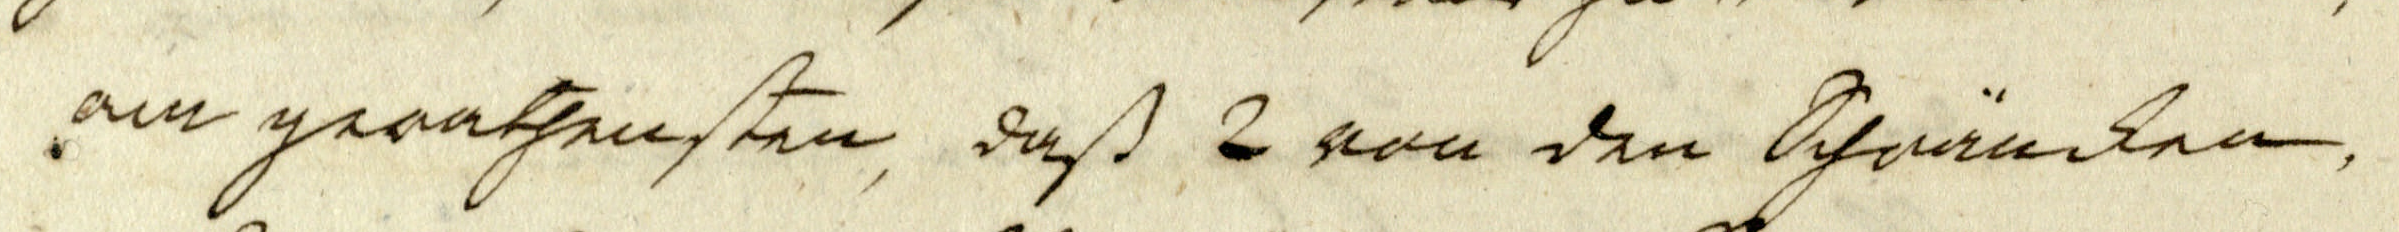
am gerathensten, daß 2 von den Schräncken,
